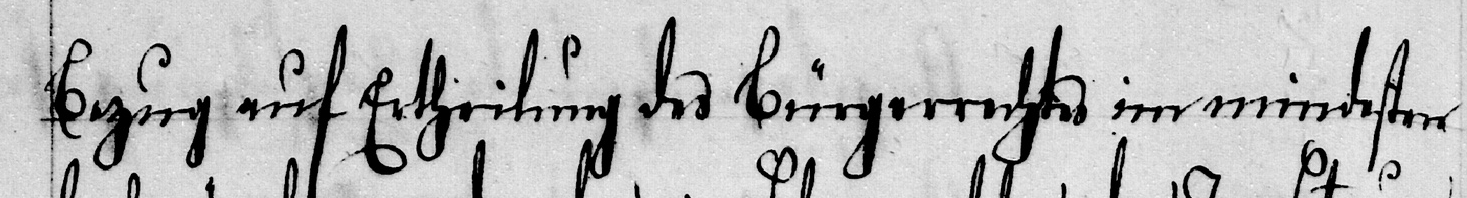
Bezug auf Ertheilung des Bürgerrechtes im mindesten
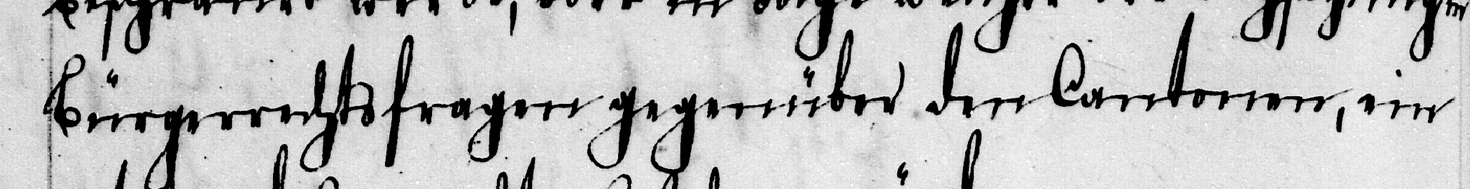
Bürgerrechtsfragen gegenüber den Cantonen, ein
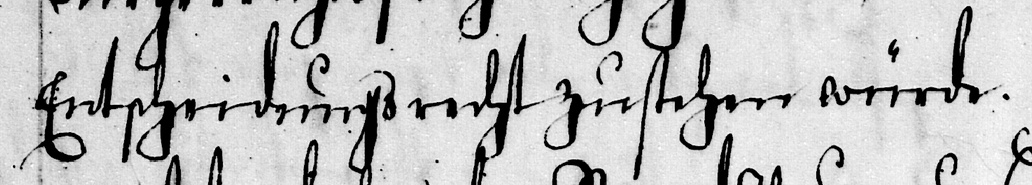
Entscheidungsrecht zustehen würde.
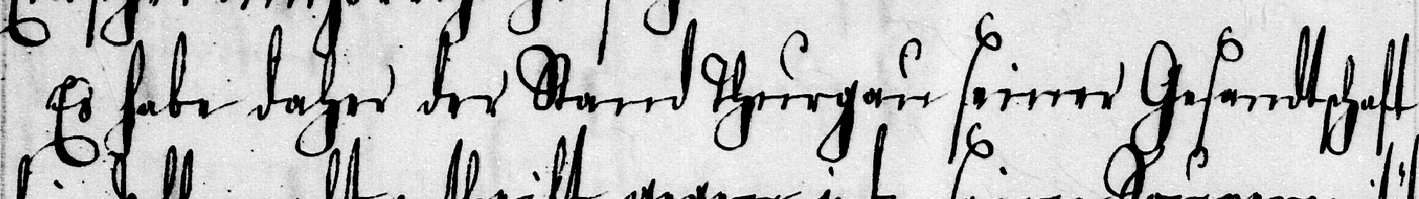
Es habe daher der Stand Thurgau seiner Gesandtsch¬
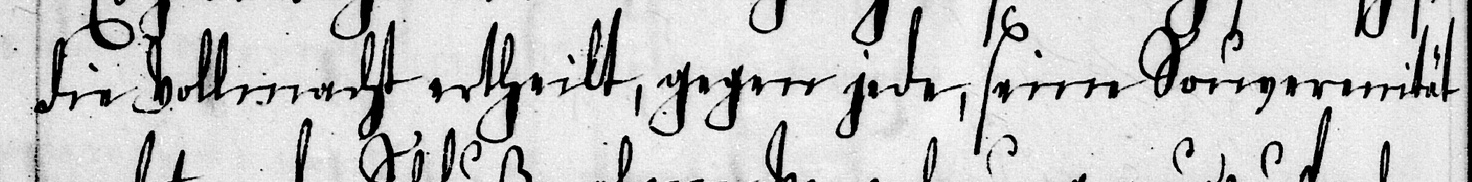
die Vollmacht ertheilt, gegen jede, seine Souverenität
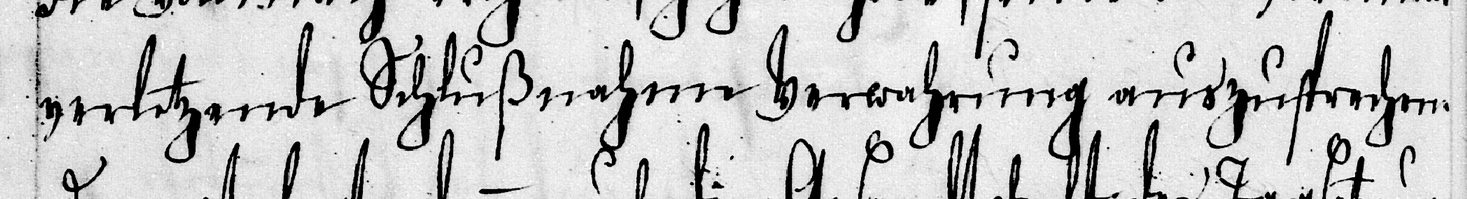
verletzende Schlußnahme Verwahrung auszusprechen.
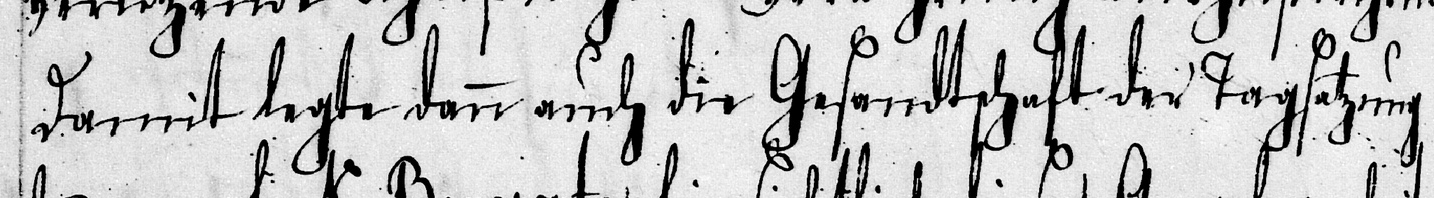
Damit legte dann auch die Gesandtschaft der Tagsatz¬
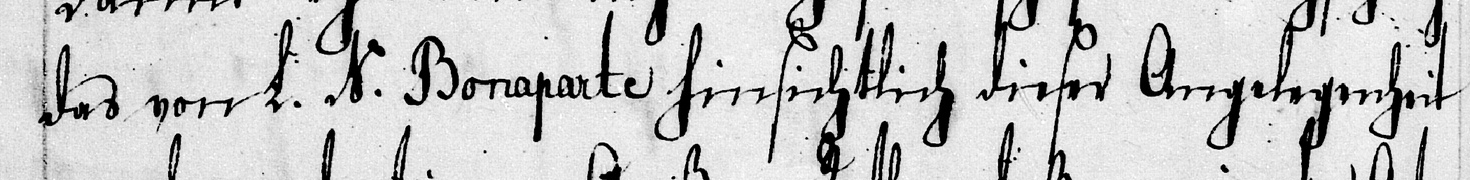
das von L. N. Bonaparte hinsichtlich dieser Angelegenheit
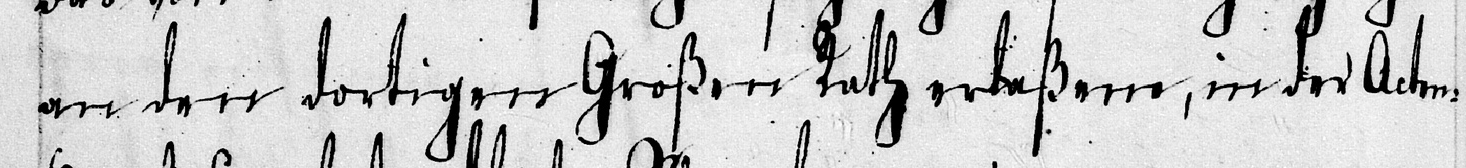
an den dortigen Großen Rath erlaßene, in der Act¬
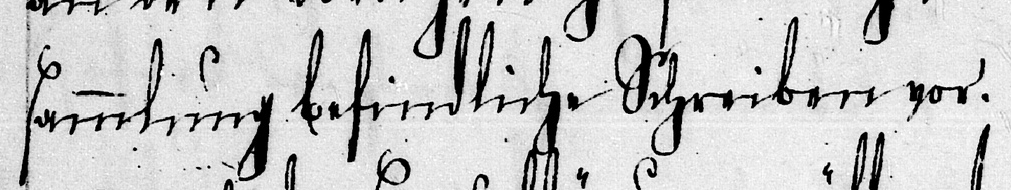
sammlung befindliche Schreiben vor.
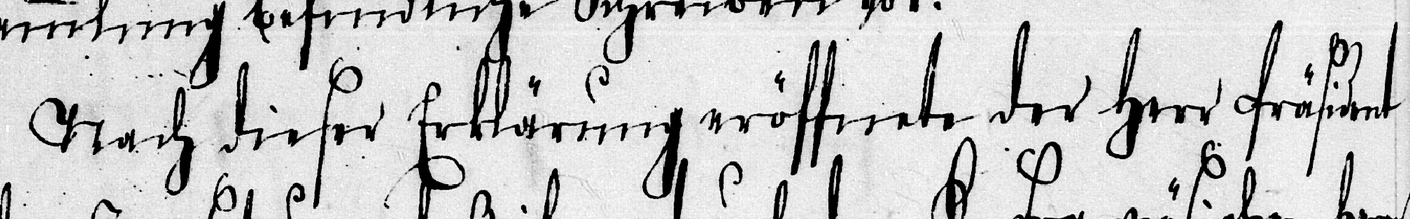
Nach dieser Erklärung eröffnete der Herr Präsi¬
